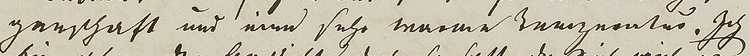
genschaft und eine sehr warme Temperatur. Ich
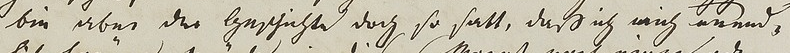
bin aber der Geschichte doch so satt, daß ich mich unend-
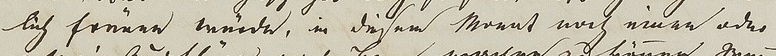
lich freuen würde, in diesem Monat noch einen oder
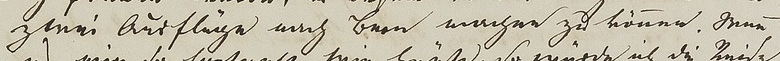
zwei Ausflüge nach Bern machen zu können. Wenn
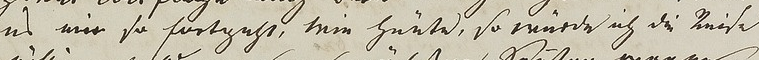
es mir so fortgeht, wie heute, so würde ich die Reise
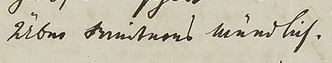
Über Weiteres mündlich.
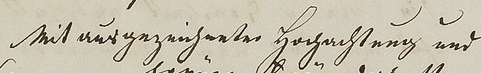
Mit ausgezeichneter Hochachtung und
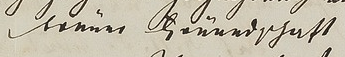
treuer Freundschaft
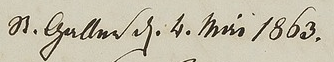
St. Gallen d. 4. Mai 1863.
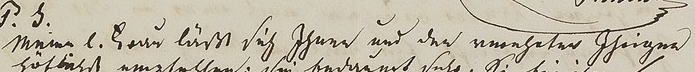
Meine l. Frau läßt sich Ihnen und den verehrten Ihrigen
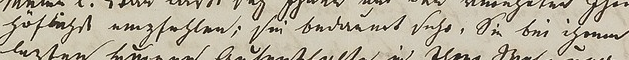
höflichst empfehlen; sie bedauert sehr, sie bei ihrem
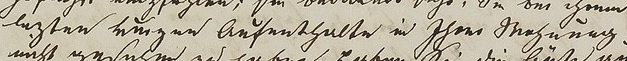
lezten kurzen Aufenthalte in Ihrer Wohnung
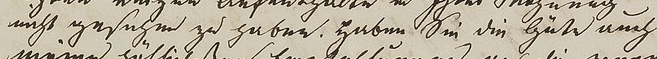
nicht gesehen zu haben. Haben Sie die Güte auch
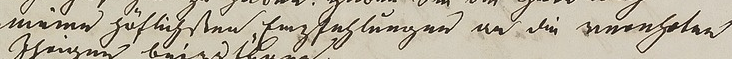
meine höflichsten Empfehlungen an die verehrten
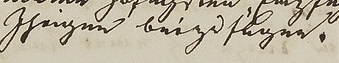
Ihrigen beizufügen.
